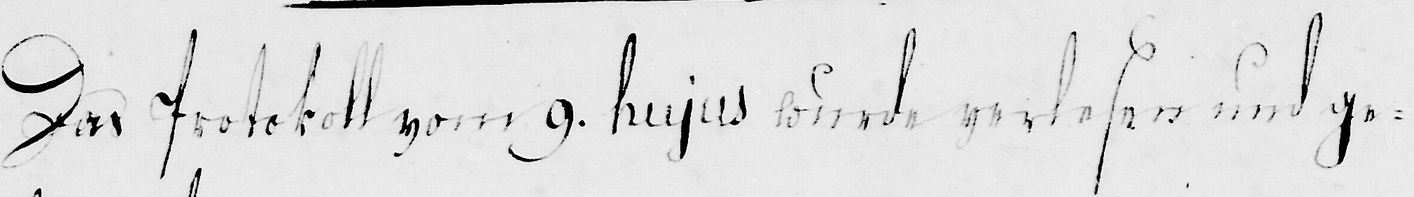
Das Protokoll vom 9. hujus wurde verlesen und ge¬
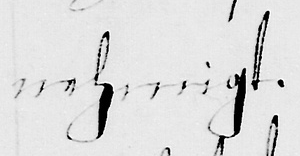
nehmigt.
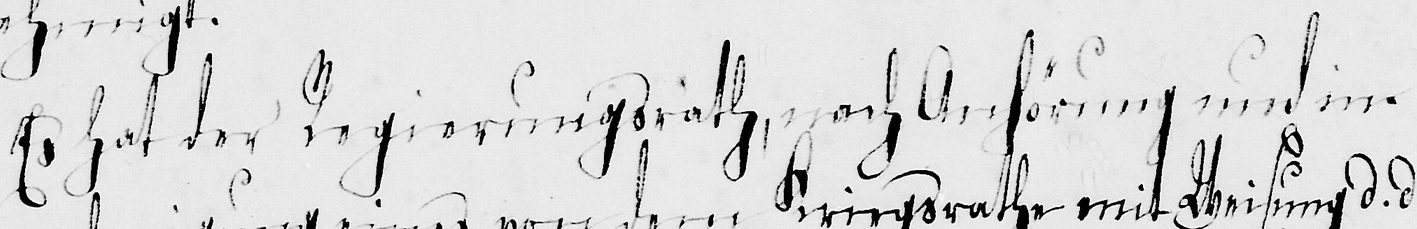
Es hat der Regierungsrath, nach Anhörung und in
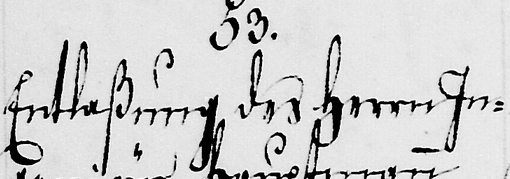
Entlaßung der wegen
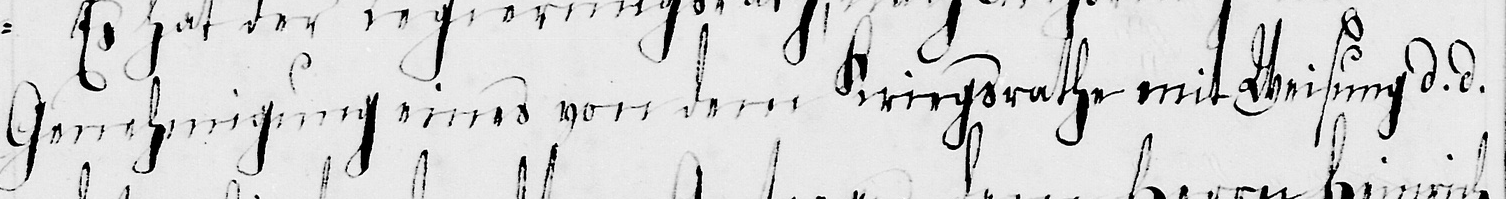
Genehmigung eines von dem Kriegsrathe mit Weisung d. d.
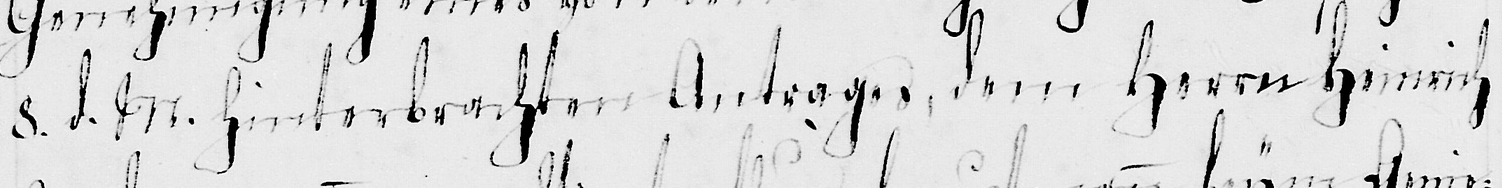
8. d. M. hinterbrachten Antrages, dem Herrn Heinrich
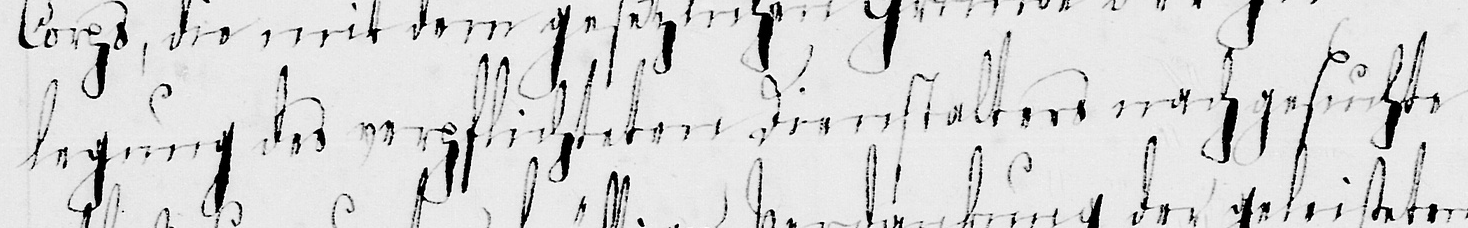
legung des verpflichteten Dienstalters nachgesuchte
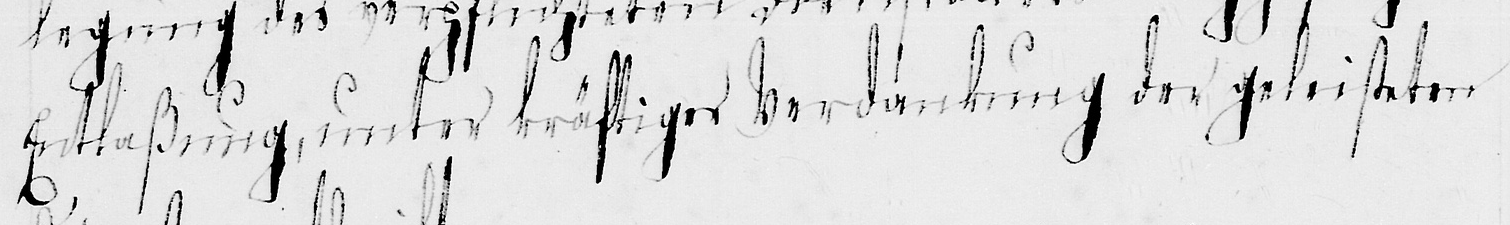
Entlaßung, unter kräftiger Verdankung der geleisteten
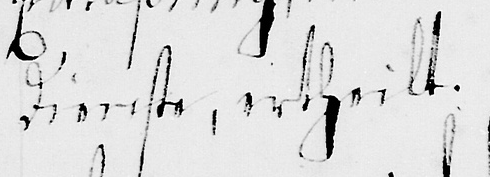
Dienste, ertheilt.
